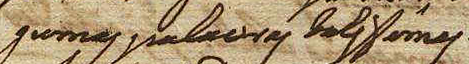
gumas palavras balsfemas
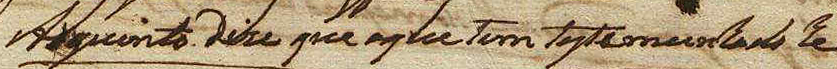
Ao quinto dize que o que tem testemunhado he
